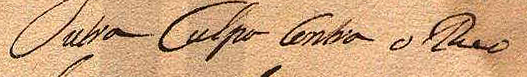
Outra Culpa contra o Reo
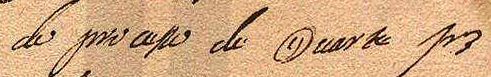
do processo de Duarte frz
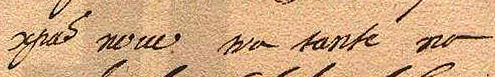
xpaõ nouo tratante na
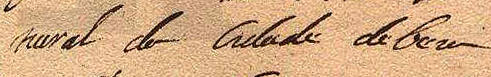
tural da Cidade de beia
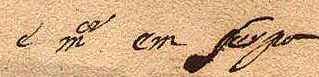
e mor em Serpa
